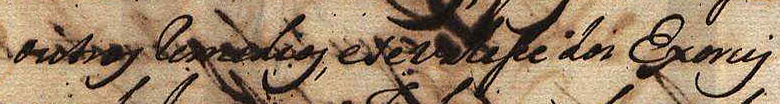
outros Remedios, e se valesse dos Exorcis
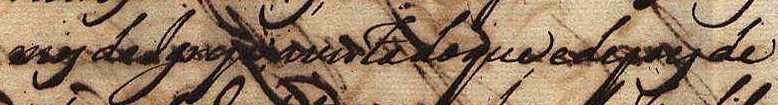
mos de Igreja a vista do que, e depois de
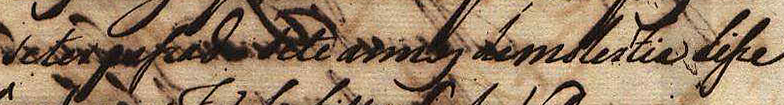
se ter passado sete annos de molestia disse
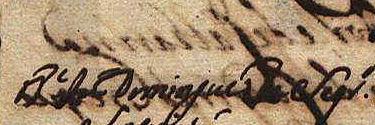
O Pe Io Domingues da Seqr.a
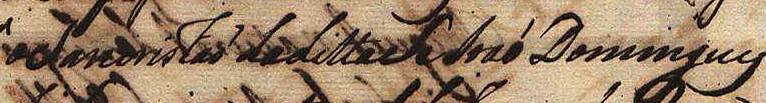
o Sancristaõ da ditta Se Ioaõ Domingues
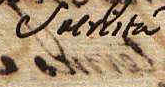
Sacristā
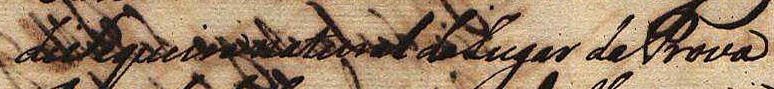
de Sequeira natural do Lugar da Prova
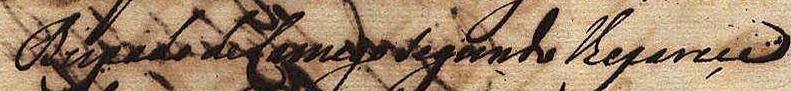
Bispado de Lamego segundo lhe parece
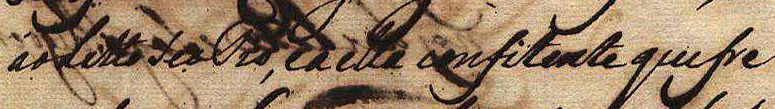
ao ditto seo Tio, e a ella confitente que fre
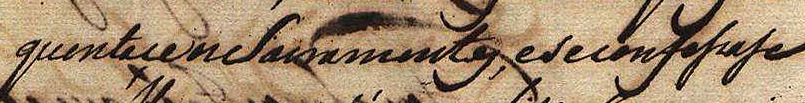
quentace os Sacramentos, e se confessase
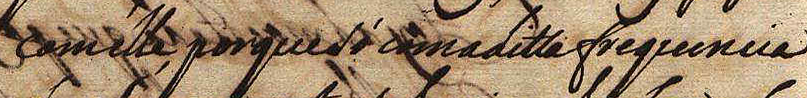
com elle, porque só com a ditta frequencia
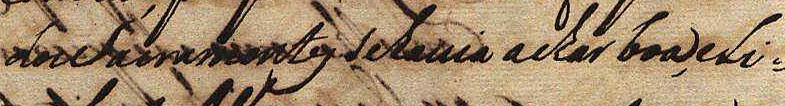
dos Sacramentos se hauia achar boa, e Li
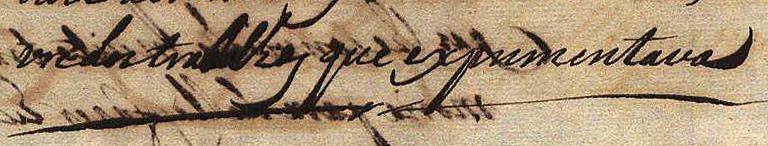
vre dos trabalhos que exprimentava
